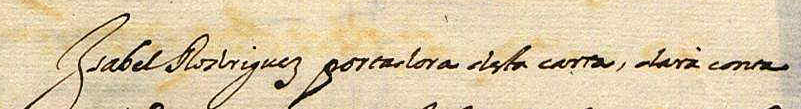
Jsabel Rodriguez portadora desta carta, darà conta
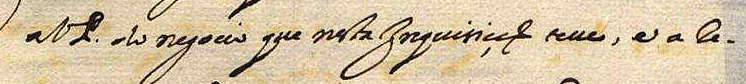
a V P. do negocio que nesta Jnquisiçaõ teue, e a Re
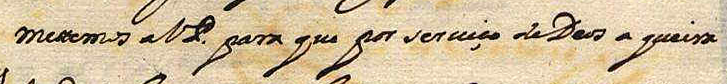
mettemos a V P. para que por seruiço de Deos a queira
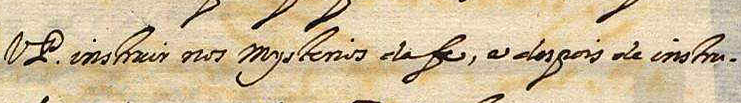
V P. instruir nos mysterios da fe, e despois de instru
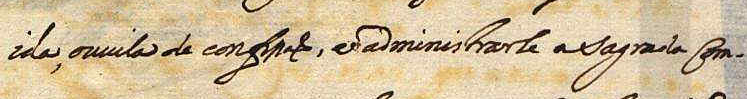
ida, ouuila de confissaõ, e administrarle a Sagrada Com
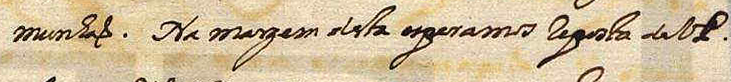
munhaõ. Na margem desta esperamos Reposta de V P.
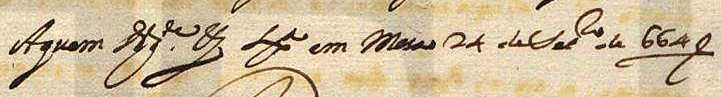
A quem Ds̄ g.de &ꝭ Lxa em Mesa 24 de Setro de 664
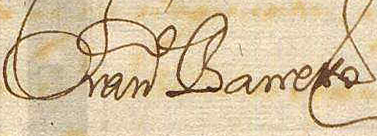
Franco Barretto
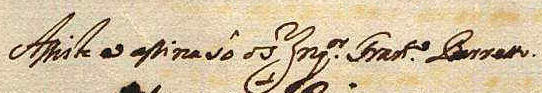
Assiste e assina só o s.r Jnq.or Fran.co Barreto
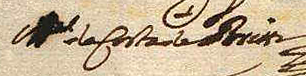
Mel da Costa de Britto
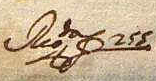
Reg.da fL 255
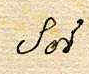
Sor̄
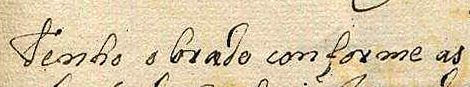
Tenho obrado conforme as
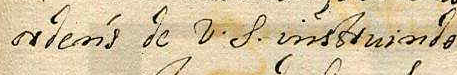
ordens de V. S. instruindo
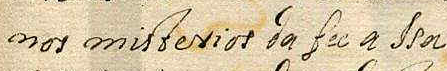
nos misterios da fee a Isa
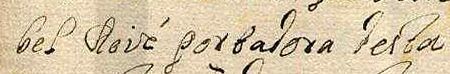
bel Roiz̄ portadora desta
